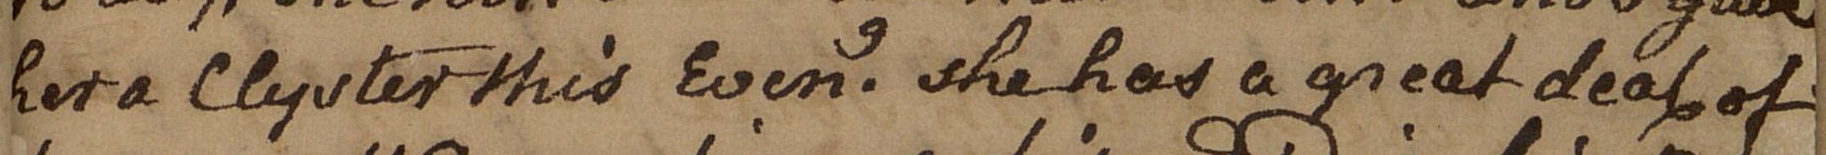her a Clyster this Even^g. she has a great deal of
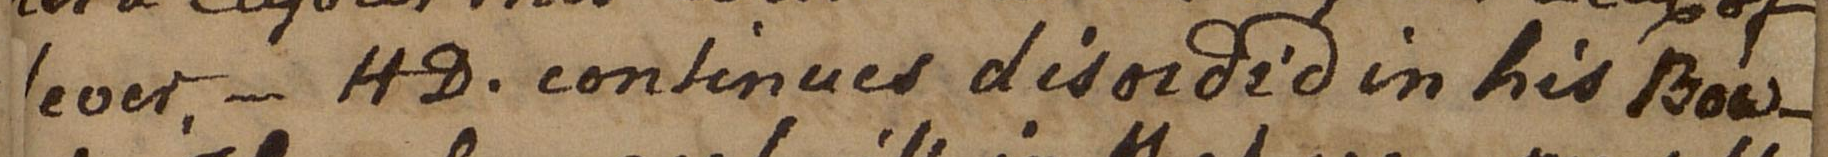fever- HD. continues disordr'd in his Bow-
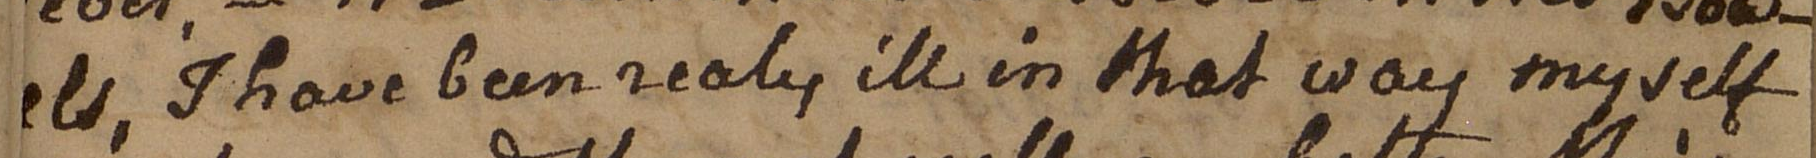els, I have been realy ill in that way myself
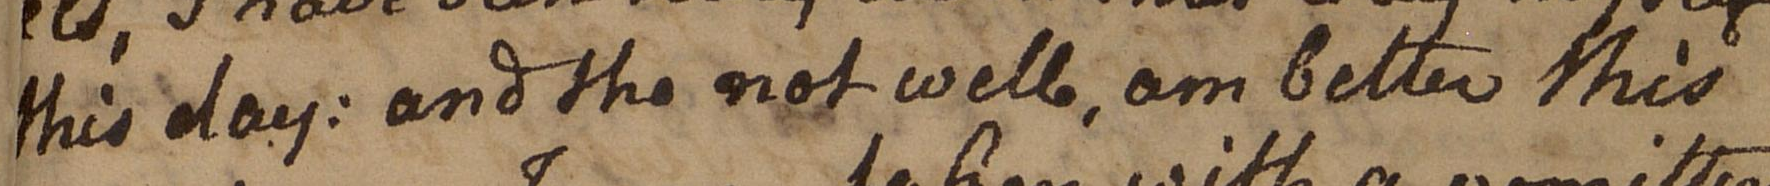this day: and tho not well, am better this
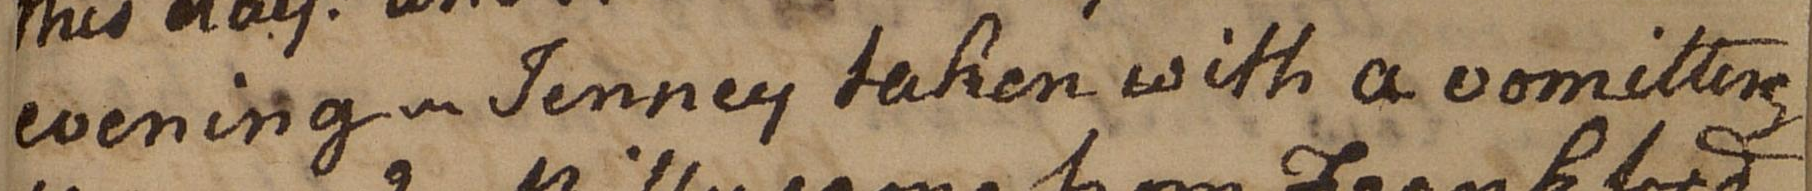evening- Jenney taken with a vomitting
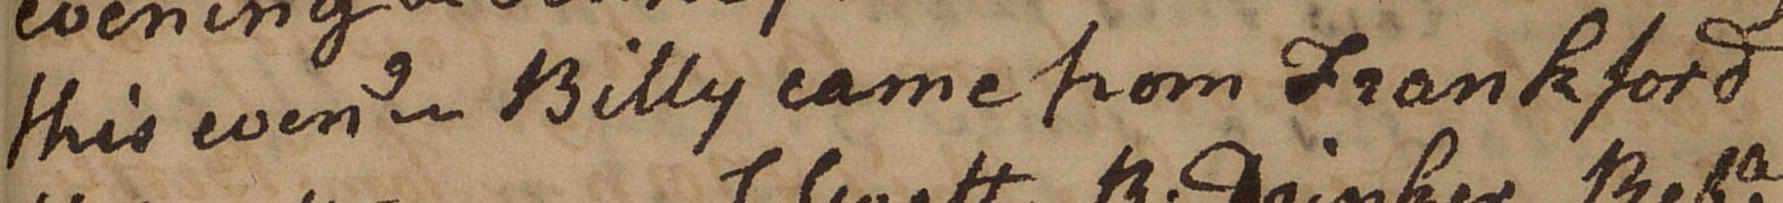his even^g- Billy came from Frankford
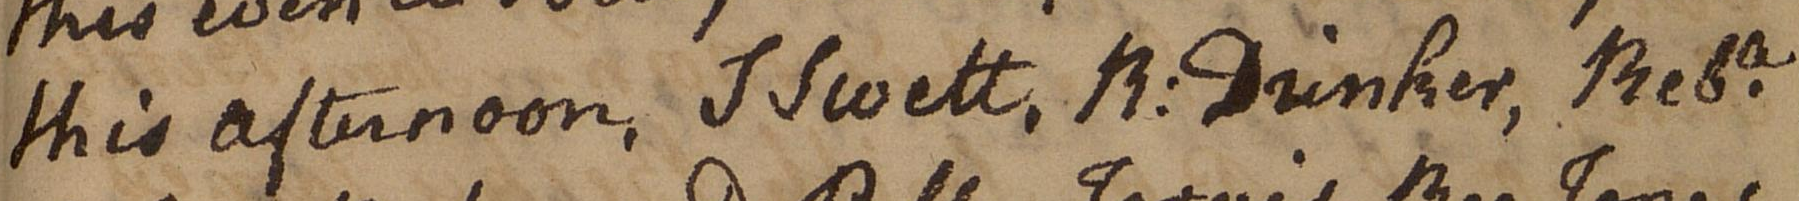this afternoon, S Swett, R: Drinker, Reb^a.
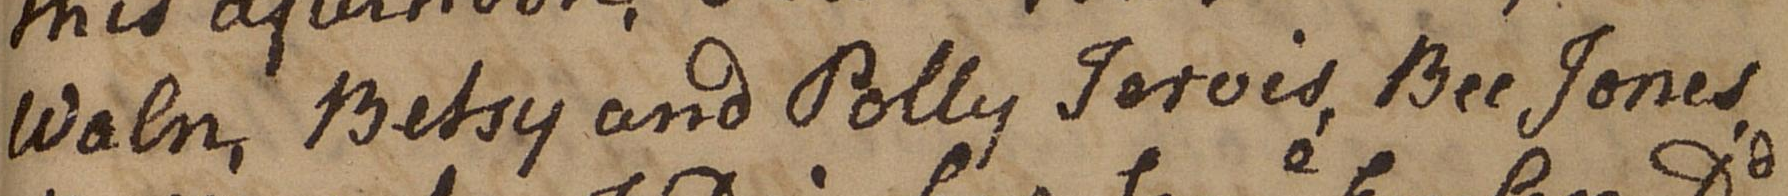Waln, Betsy and Polly Jervis, Bee Jones
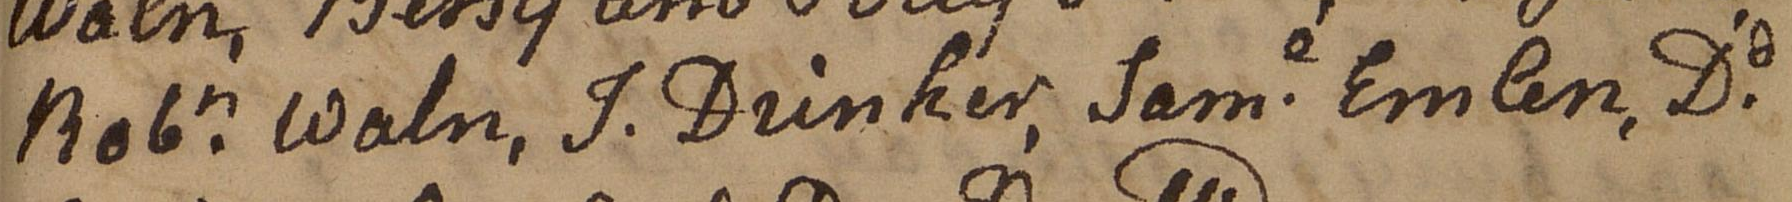Rob^t. Waln, S. Drinker, Sam^l. Emlen, D^d.
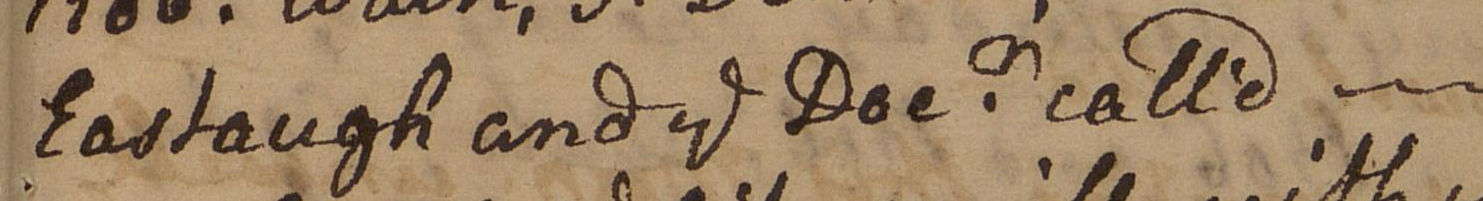Eastaugh and y^e Doc^r. call'd-
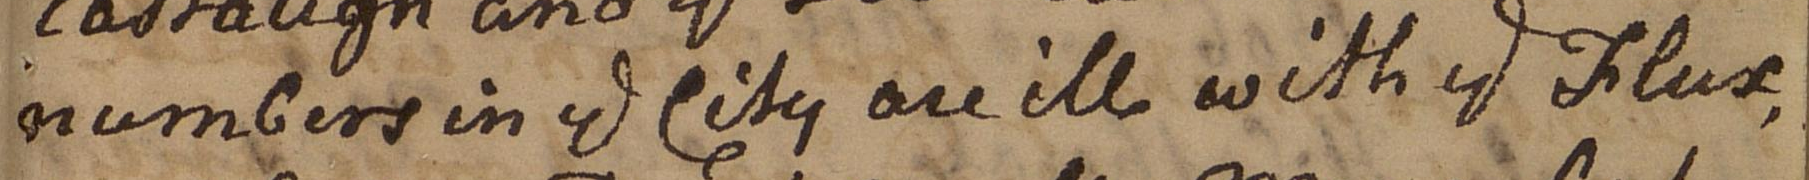numbers in y^e City are ill with y^e Flux,
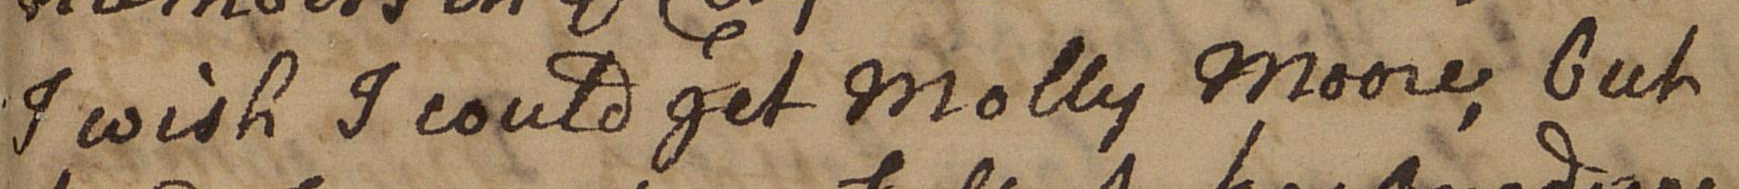I wish I could get molly Moore, but
